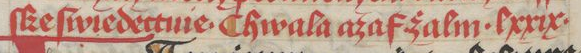ſke ſwedectuie.Chwala azaf.żalm.lxxix.
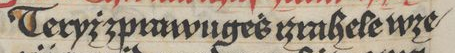Teryż zprawugeṡ izrahele wze¬
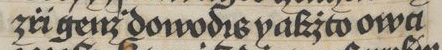zṙi genż dowodis yakżto owci
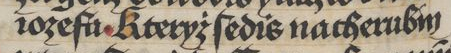iozeſu.Kteryż ſediṡ nacherubin
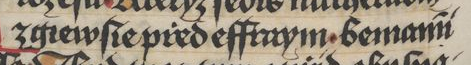zgiewſie pṙed effraym.bemamī
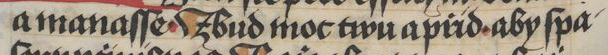a manaſſe.Zbud moc twu a pṙíd.aby ſpa¬
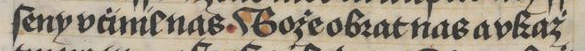ſeny vċinil nas.Boże obrat nas a vkaż
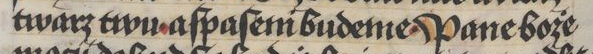twarz twu.a ſpaſeni budeme.Pane boże
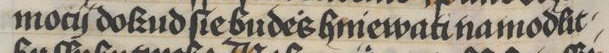mocij dokud ſie budeṡ hniewati namodlit¬
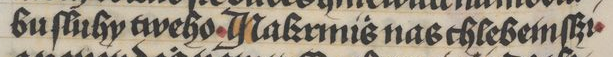bu ſluhy tweho.Nakrmiṡ nas chlebemſlzí.
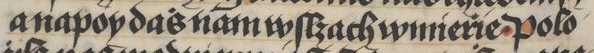a napoy daṡ nam wſlzach wmieṙíe.Polo¬
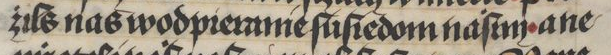żils nas wodpieraníe ſuſiedom naẛim.a ne¬
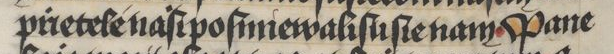pṙietelé naẛi poſmiewali ſu ſie nam.Pane
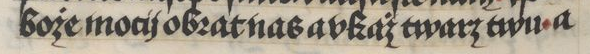boże mocij obrat nas a vkaż twarz twu.a
